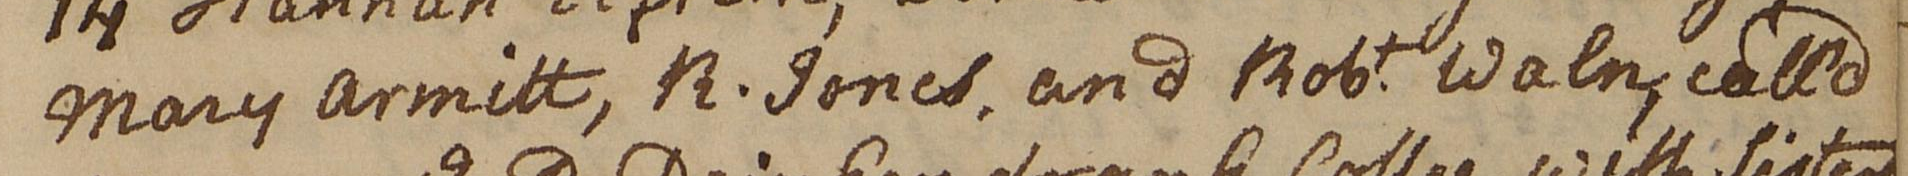Mary Armitt, R. Jones, and Rob^t. Waln, call'd
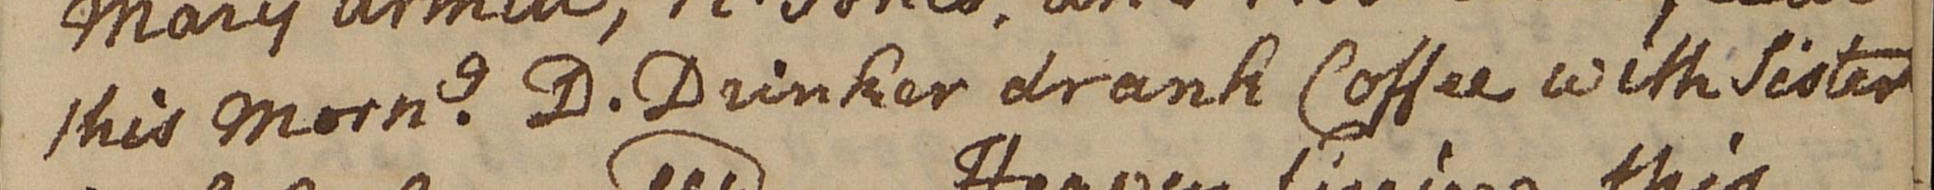this Morn^g. D. Drinker drank Coffee with Sister
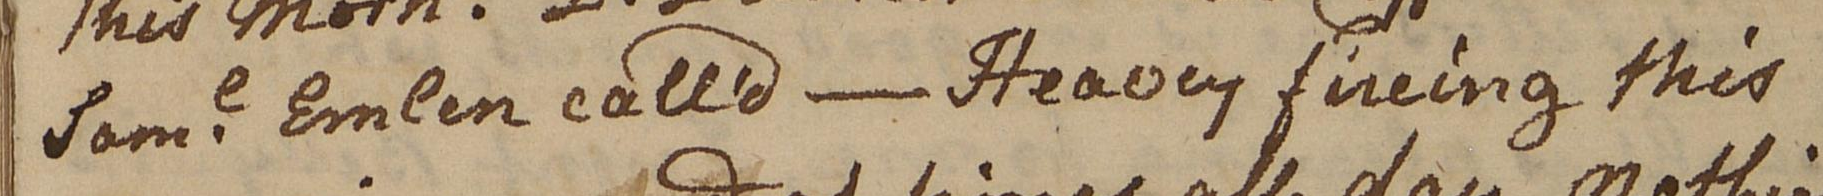Sam^l. Emlen call'd- Heavey fireing this
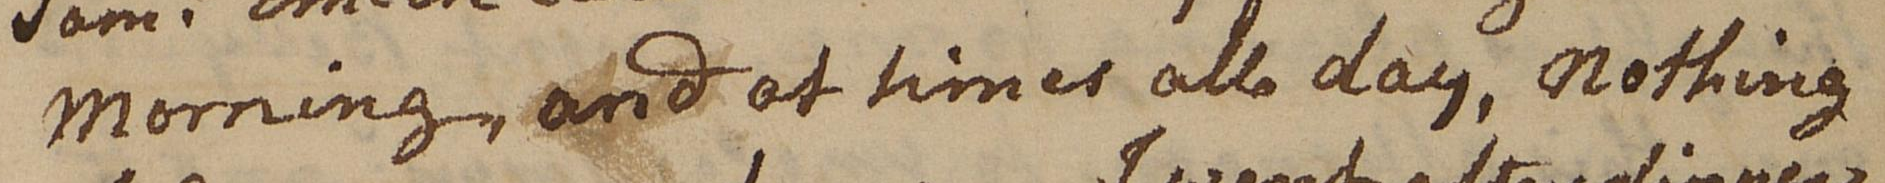Morning, and at times all day, nothing
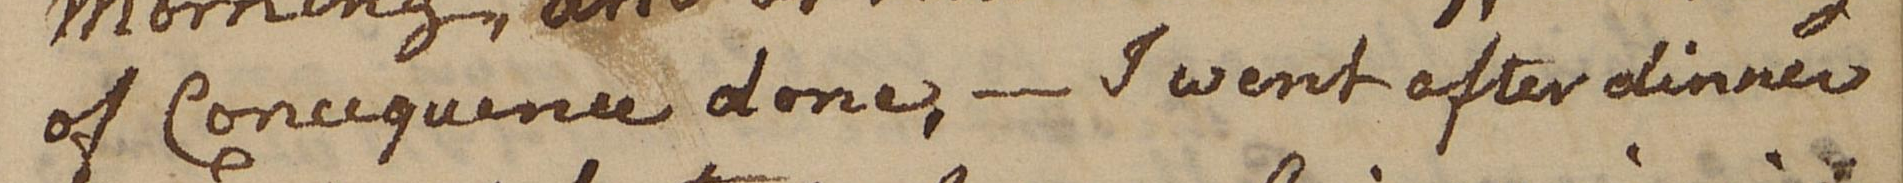of Concequence done,- I went after dinner
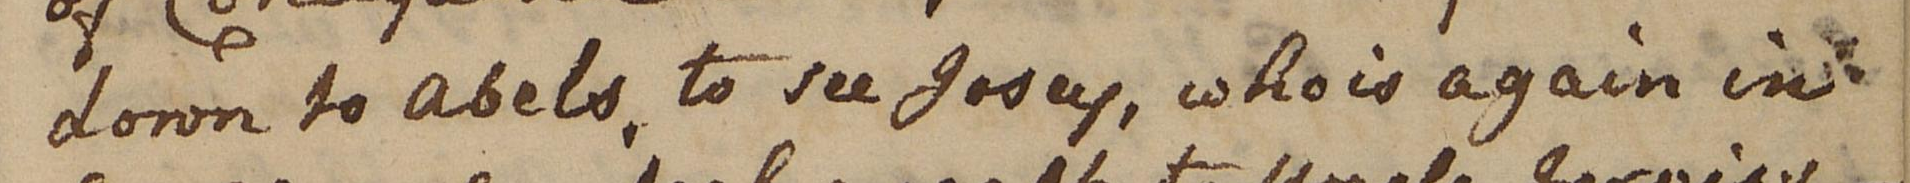down to Abels to see Josey, who is again in
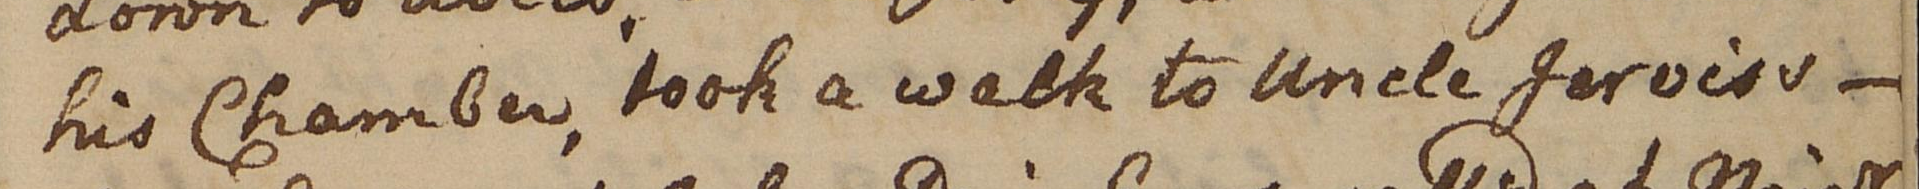his Chamber, took a walk to Uncle Jerviss-
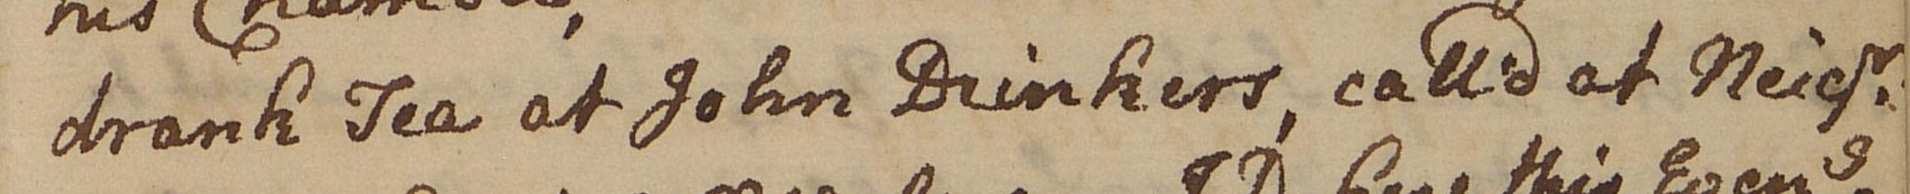drank Tea at John Drinkers, call'd at Neig^r.
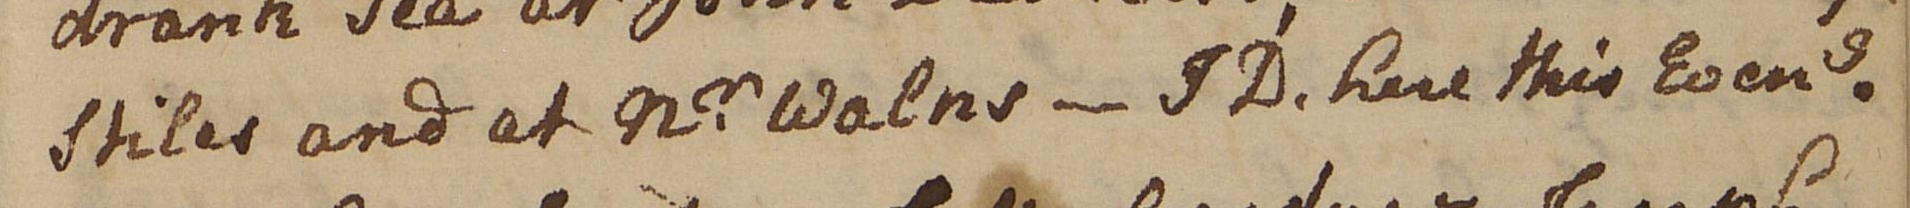Stiles and at N^r. Walns- JD. here this Even^g.
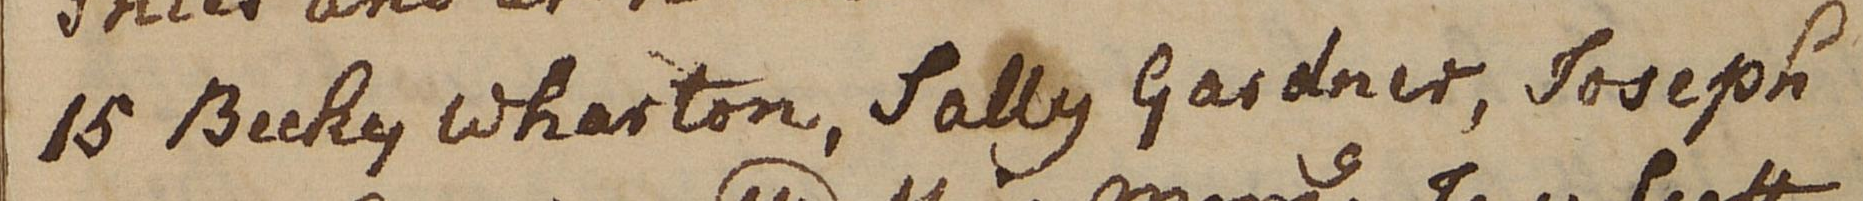15 Becky Wharton, Sally Gardner, Joseph
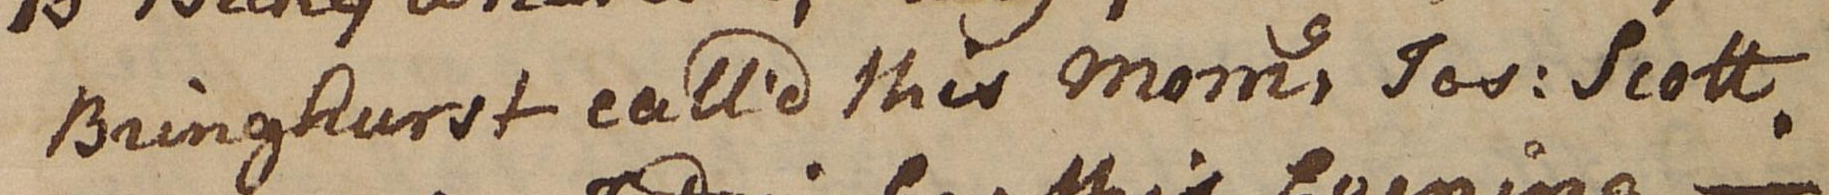Bringhurst call'd this morn^g. Jos: Scott.
